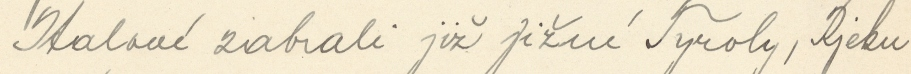Italové zabrali již jižní Tyroly, Rjeku
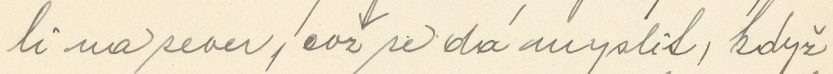li na sever, což se dá myslit, když
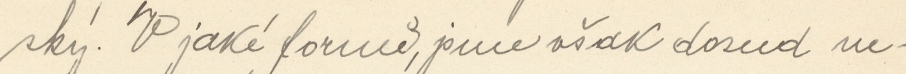ský. V jaké formě jsme však dosud ne-
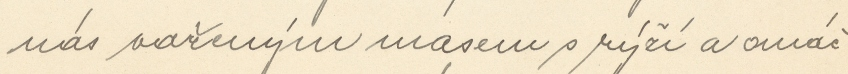nás vařeným masem s rýží a omáč-
